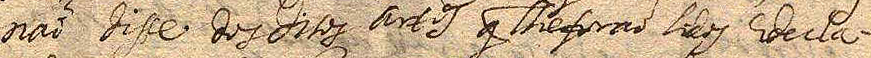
naõ disse dos ditos artos q̄ lhe foraõ lidos E decla
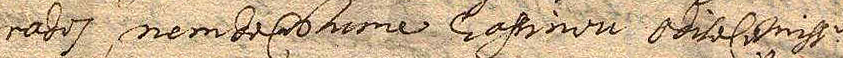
rados, nem do Costume E assinou o dito Comisso
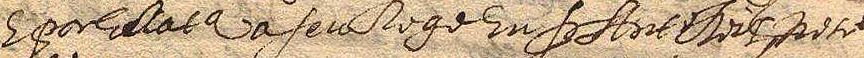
E por Ella ta a seu Rogo Eu fr Anto Roiz notro
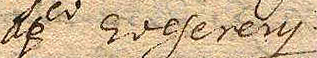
apco E o escreuj.
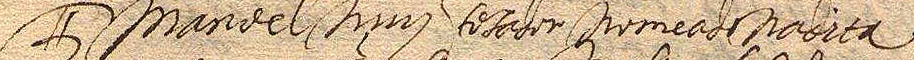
item Manoel nuiz̄ tozador Nomeado Na dita
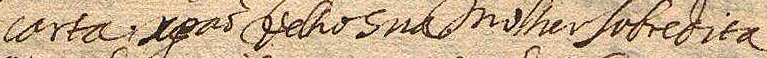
carta xpaõ velho sua Molher sobredita
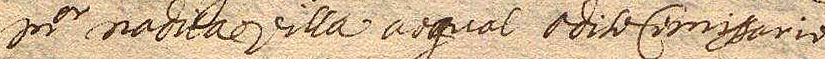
mor na dita Villa ao qual o dito Comissario
